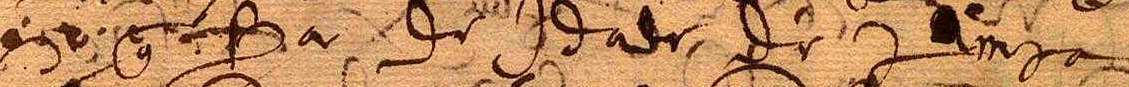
e q̄ ꞩa de Jdade de trimta
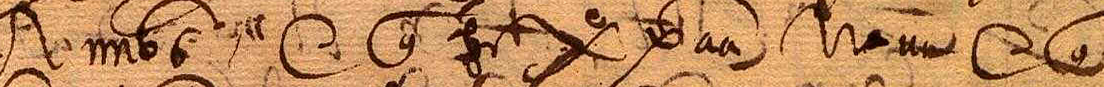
Annos̄ e q̄ he Xpaā Noua e q̄
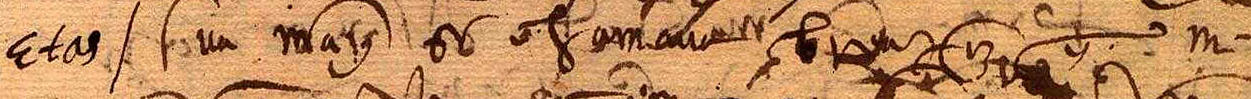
E tas / sua mãy se chamaua breatiz̄ gomez
